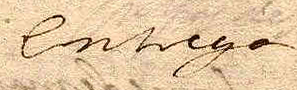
entrega
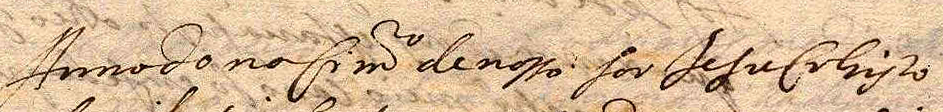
Anno do nacimto de nosso sor Jesu Crhisto
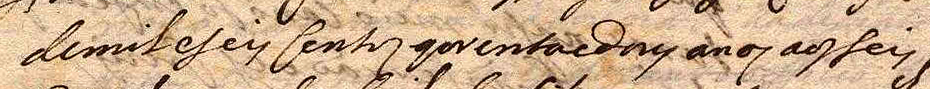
de mil e seisCentos qorenta e dous anos aos seis
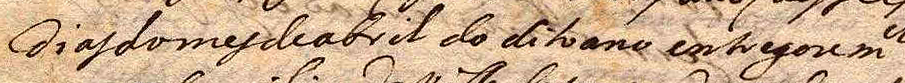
dias do mes de abril do dito ano entregou mel
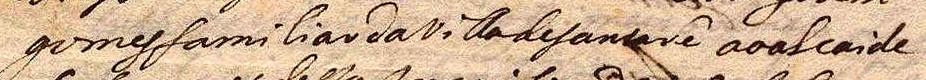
gomes familiar da villa de santarē ao alcaide
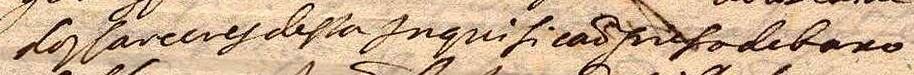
dos Carceres desta Jnquisiçaõ preso debaxo
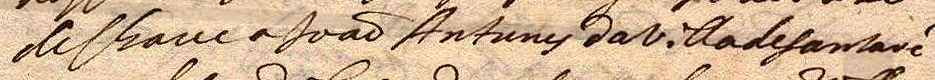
de Chaue a João Antunes da villa de santarē
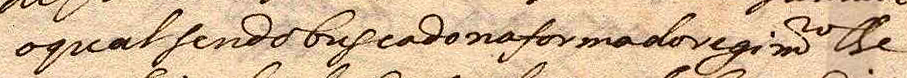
o qual sendo buscado na forma do regimto lhe
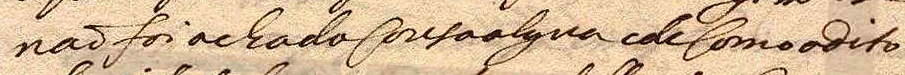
naõ foi achada Cousa algua e de Como o dito
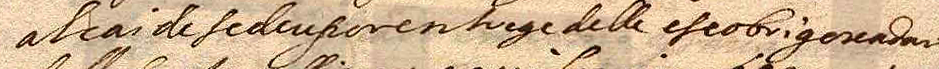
alcaide se deu por entrege delle e se obrigou a dar
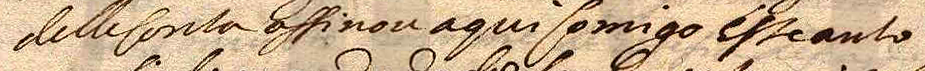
delle Conta assinou aqui Comigo este auto
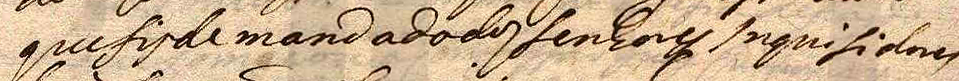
que fis de mandado dos senhores Inquisidores
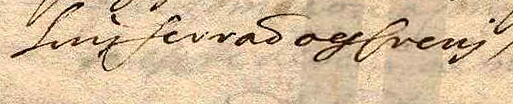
Luis ferraõ o esCreuj /
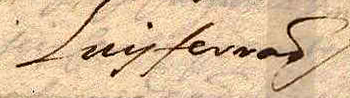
Luis ferraõ
